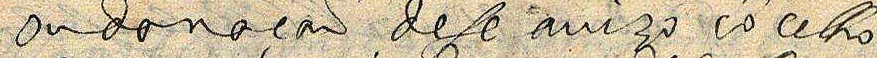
ou danaçaõ dese auizo cōcelho
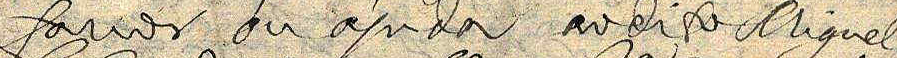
fauor ou ajuda ao dito Miguel
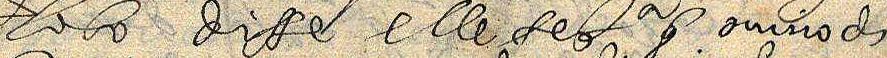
lobo disse elle testa q̄ ouuio di
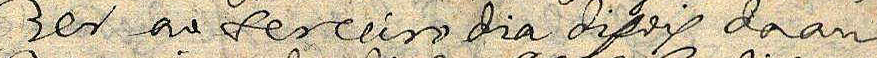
zer ao terceiro dia dipois da au
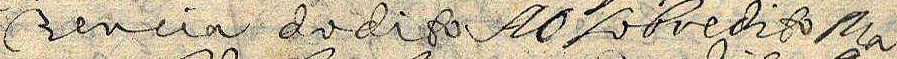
zencia do dito Ao sobredito Ma
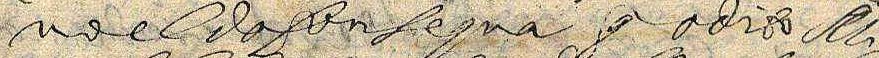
noel da fonsequa q̄ o dito Mi
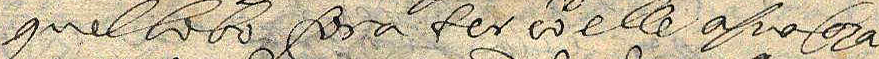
guel lobo fora ter cō elle a sua Caza
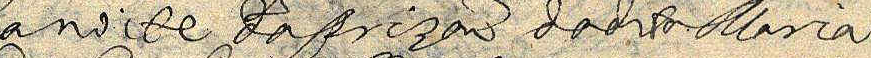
a noite da prizão da dita Maria
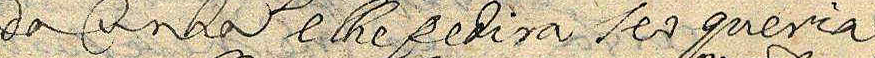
da Cunha e lhe pedira se o queria
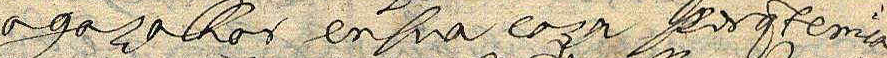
agazalhar en sua caza porq̄ temia
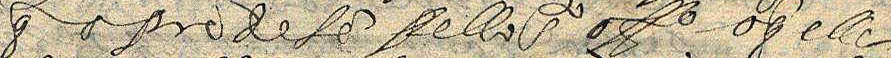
q̄ o prēdesē pello sto offo o q̄ elle
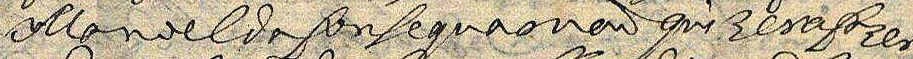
Manoel da fonsequa o naõ quizera fazer
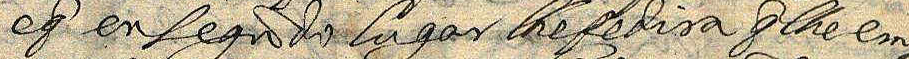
e q̄ en segūdo lugar lhe pedira q̄ lhe em
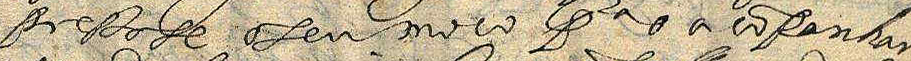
prestase o seu moço pra o acōpanhar
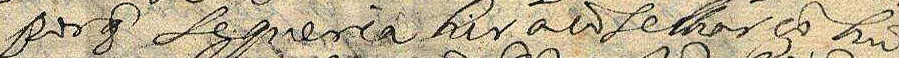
porq̄ se queria hir acōselhar cō hū
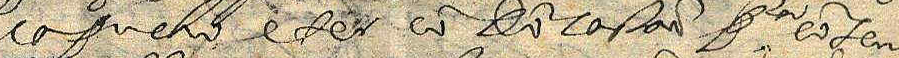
capucho e ter cō Dō castão pra cō seu
